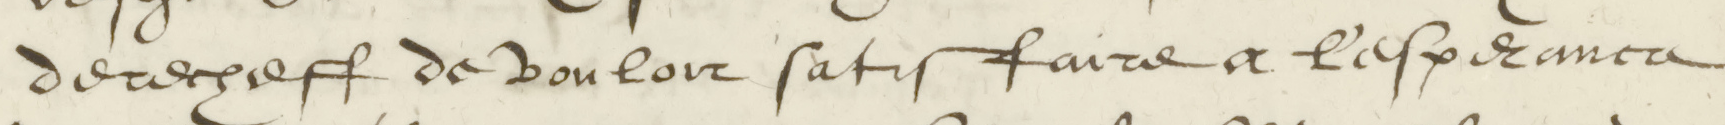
derecheff de vouloir satisfaire a l'esperance
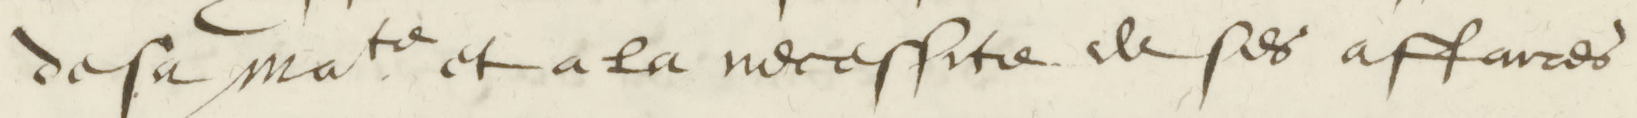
de sa Mate. et a la necessite de ses affaires
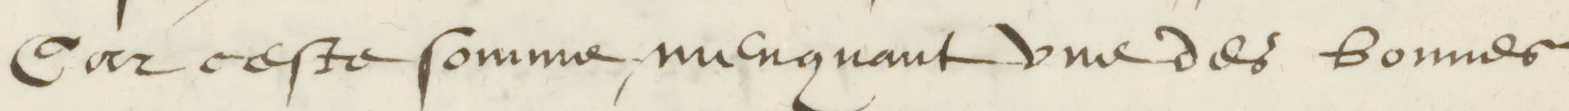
car ceste somme, menquant vne des bonnes
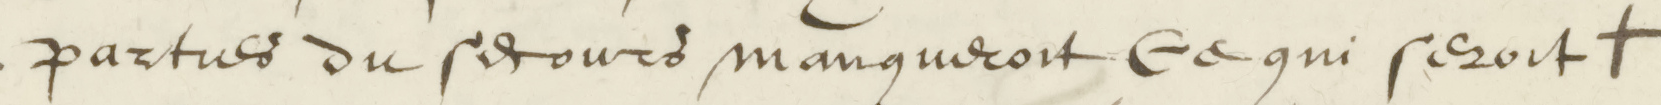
parties du secours manqueroit ce qui seroit T
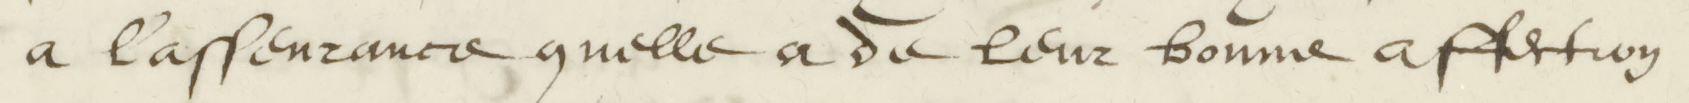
a l' asseurance quelle a de leur bonne affection.
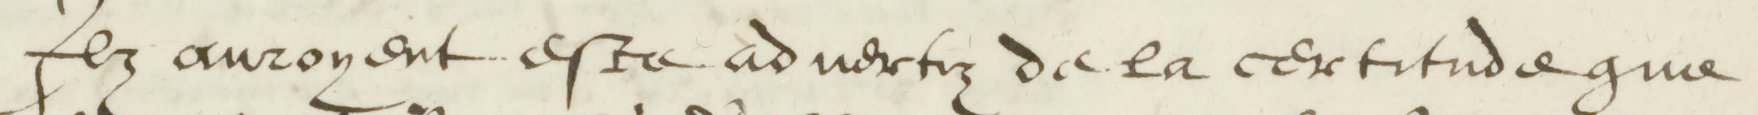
Ilz auroyent este aduertiz de la certitude que
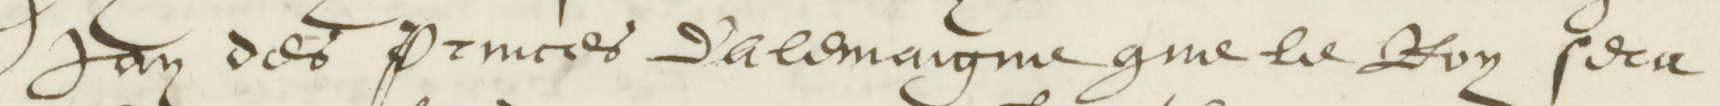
Jay des Princes d' alemaigne que le Roy sera
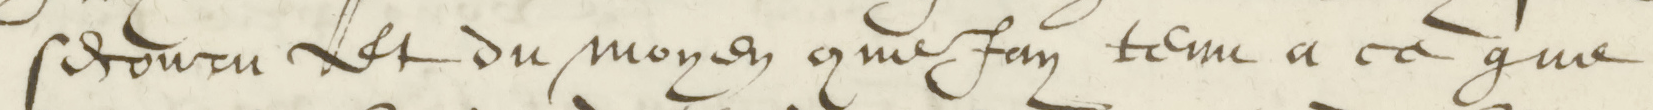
secouru et du moyen que Jay tenu a ce que
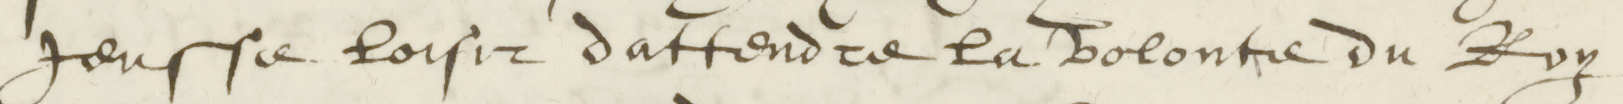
Jeusse loisir dattendre la volonte du Roy
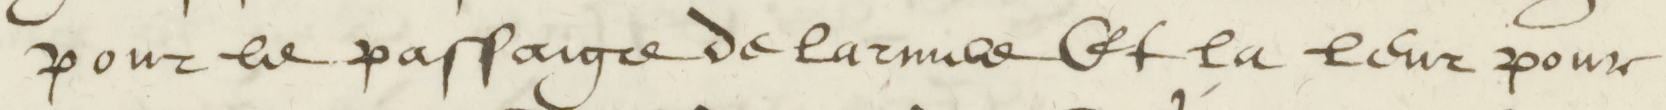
pour le passaige de larmee et la leur pour
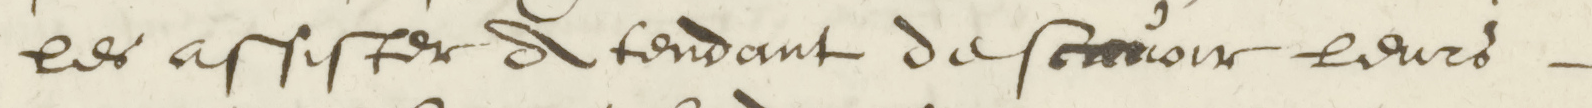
les assister Atendant de scauoir leurs
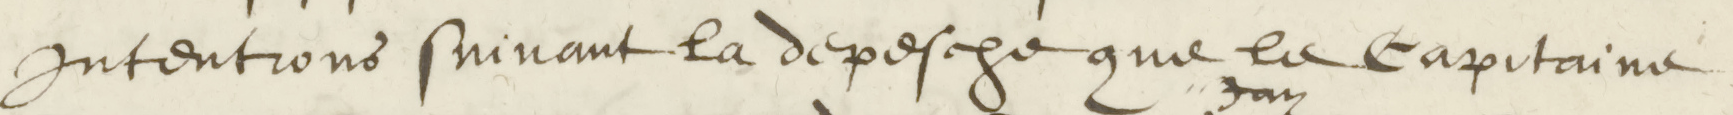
Intentions suiuant la depesche que le Capitaine
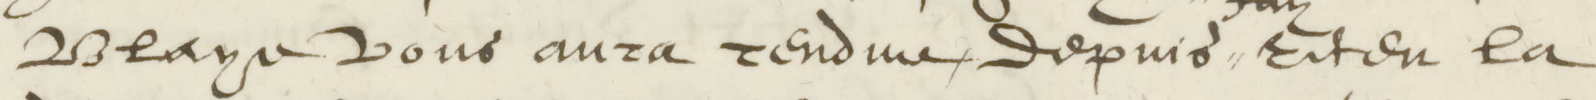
Blaye vous aura rendue, depuis ,, ''Jay recue la
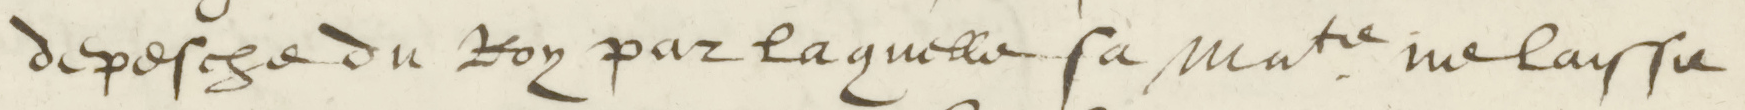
depesche du Roy par laquelle sa Mate. ne laisse
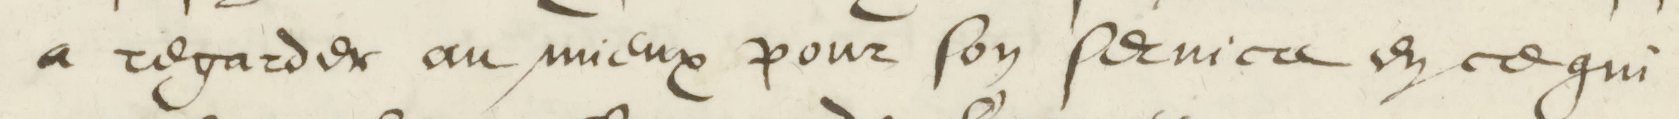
a regarder au mieux pour son seruice en ce qui
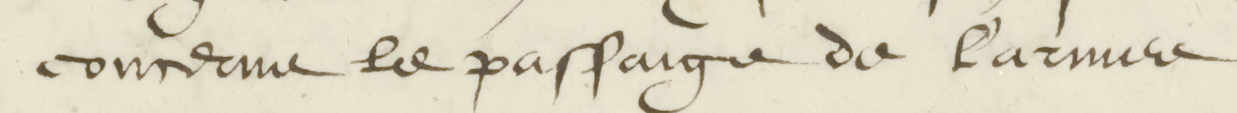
concerne le passaige de l' armee
